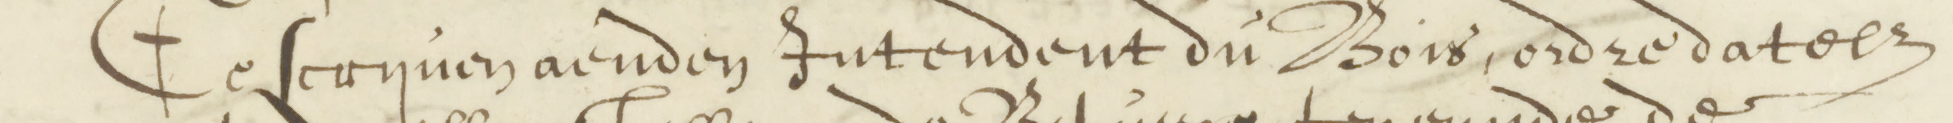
Te scryuen aenden Intendent du Bois, ordre datel
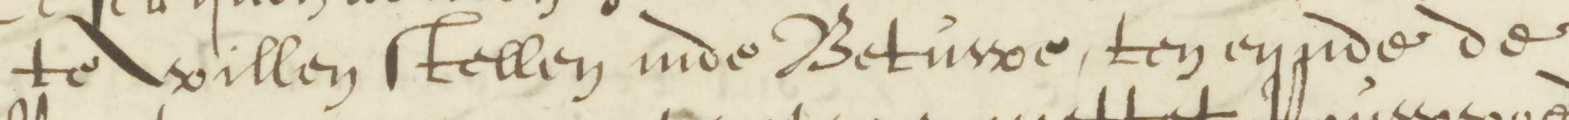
te willen stellen inde Betuwe, ten eynde de
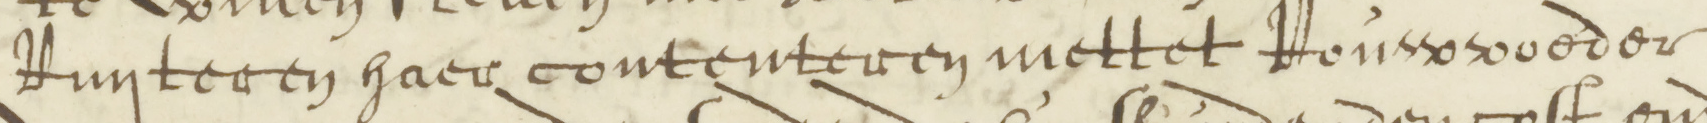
Ruyteren haer contenteren mettet Rouwvoeder
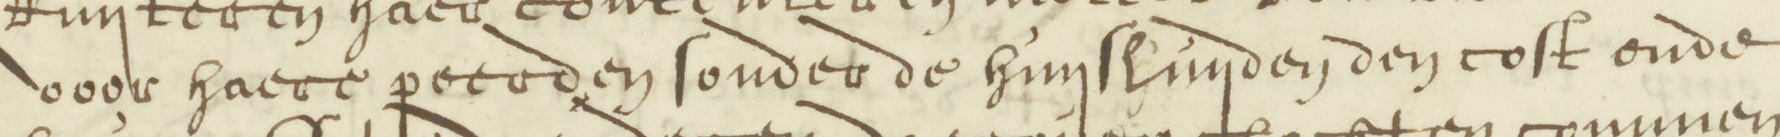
voor haere peerden sonder de huysluyden den cost ende
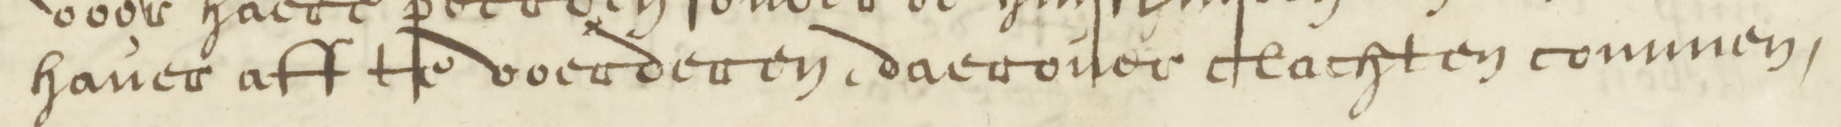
hauer aff te voerderen, daerouer clachten commen.
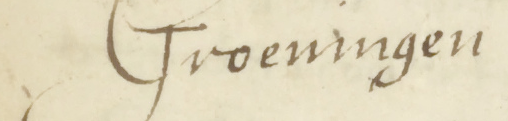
Groeningen
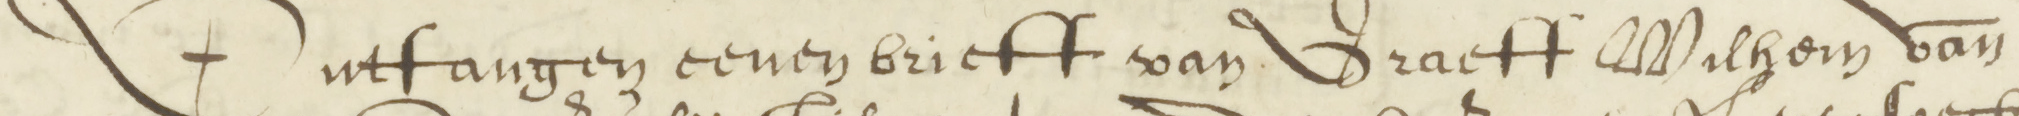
Ontfangen eenen brieff van Graeff Wilhem van
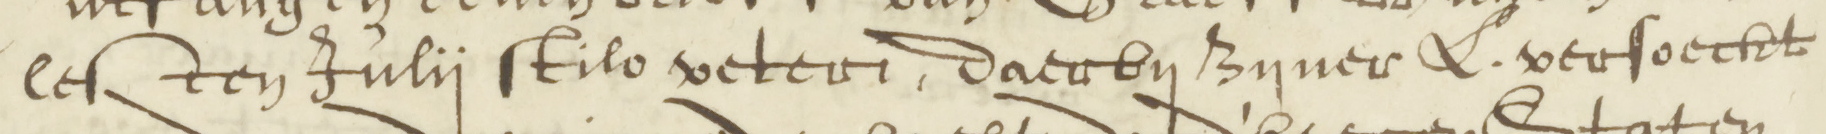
lesten Julij stilo veteri, daerby zijner L. versoeckt
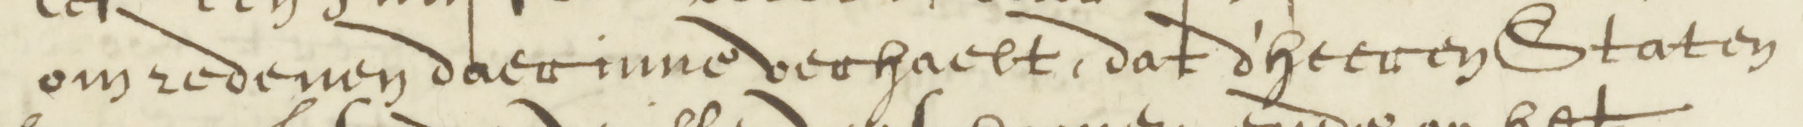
om redenen daerinne verhaelt, dat d'heeren Staten
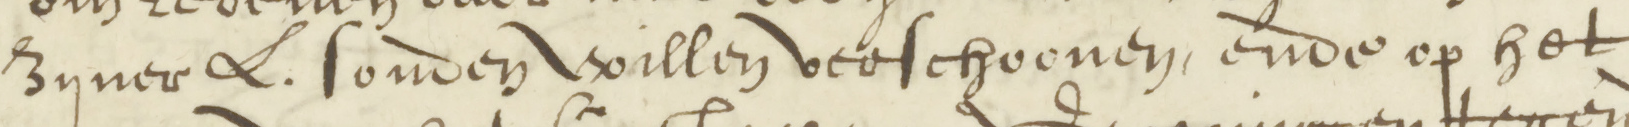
zijner L. souden willen verschoonen, ende op het
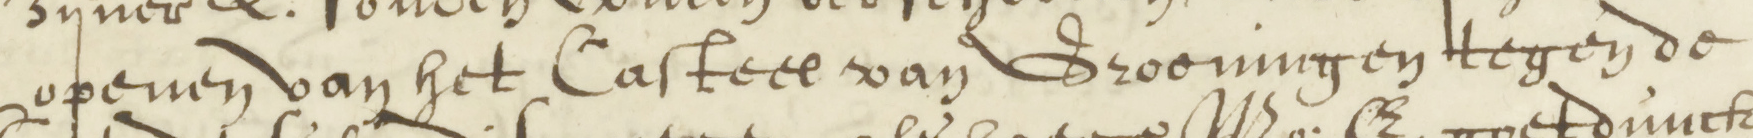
openen van het Casteel van Groeningen tegen de
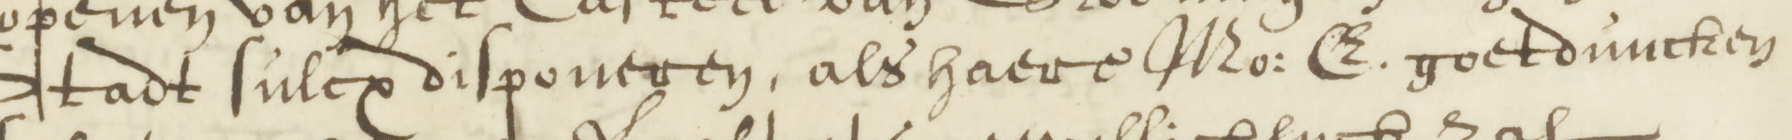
Stadt sulcx disponeren, als haere Mo:E. goetduncken
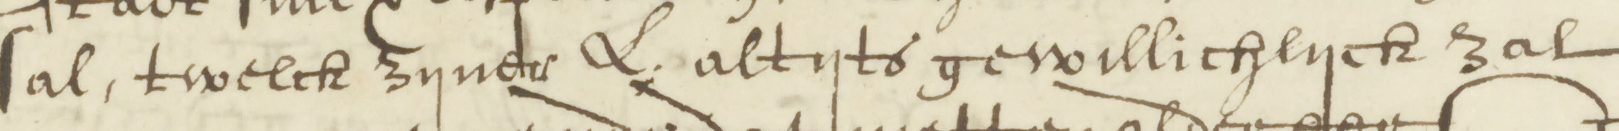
sal, twelck zijner L. altyts gewillichlyck zal
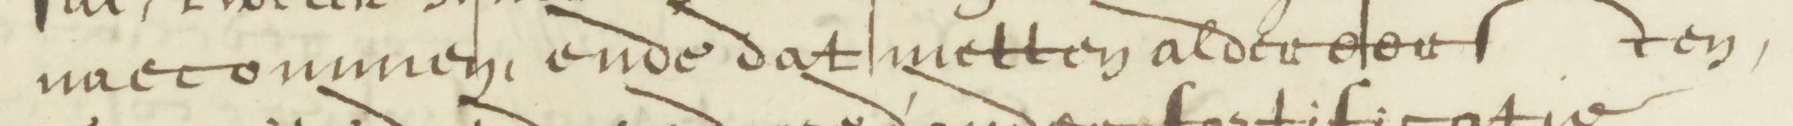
naecommen, ende dat metten aldereersten,
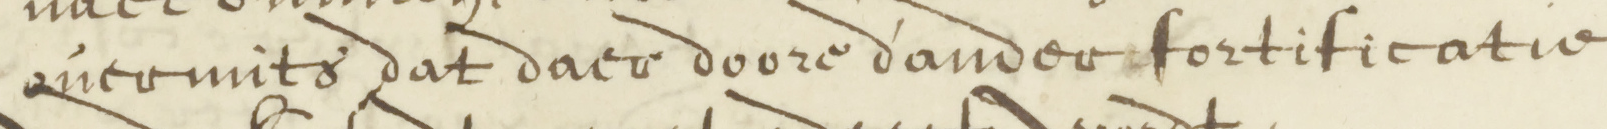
ouermits dat daer doore d'ander fortificatie
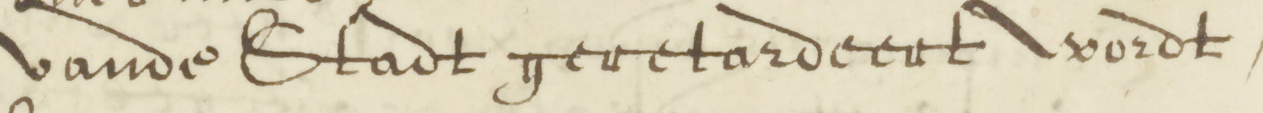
vande Stadt geretardeert wordt.
